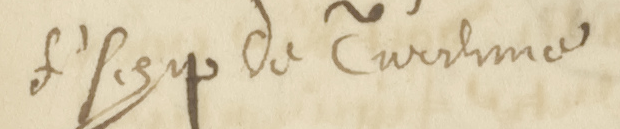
t‛schip de Turenne
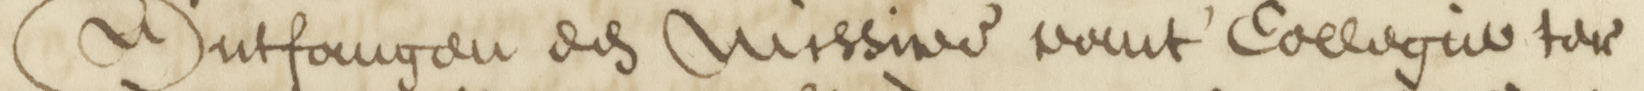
Ontfangen een Missive vant' Collegie ter
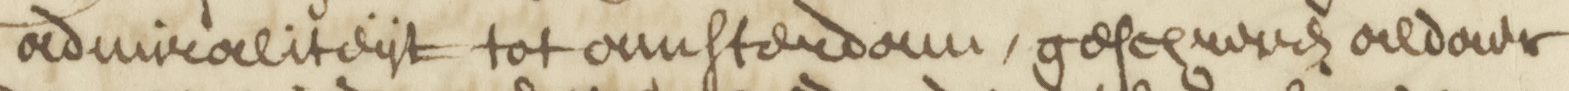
admiraliteijt tot amsterdam, geschreven aldaer
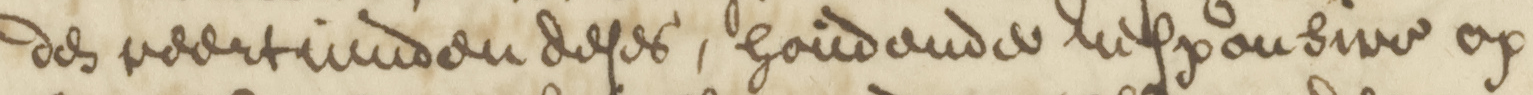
den veertienden deses, houdende responsive op
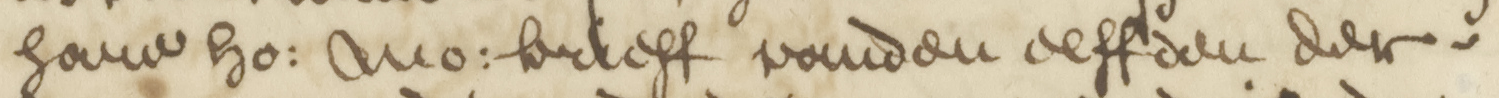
hare Ho:Mo: brieff vanden elffden der„
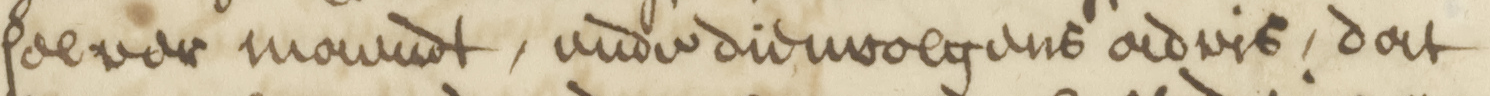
selver maendt, ende dienvolgens advis, dat
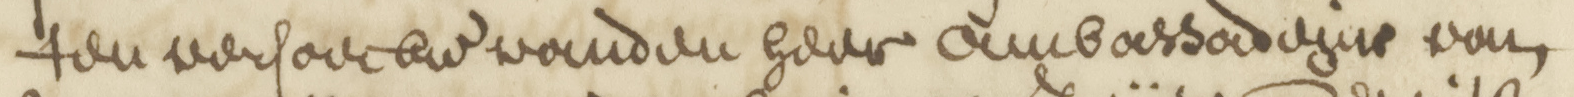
ten versoecke vanden heer Ambassadeur van
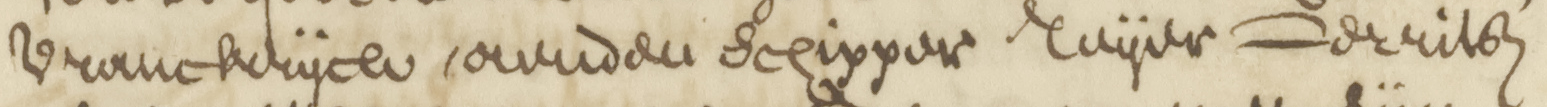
Vranckrijck, aenden Schipper Reijer Gerritsz
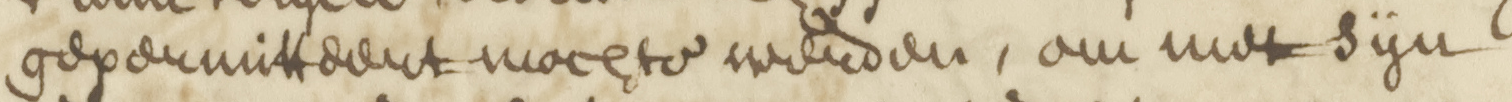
gepermitteert mochte werden, om met sijn
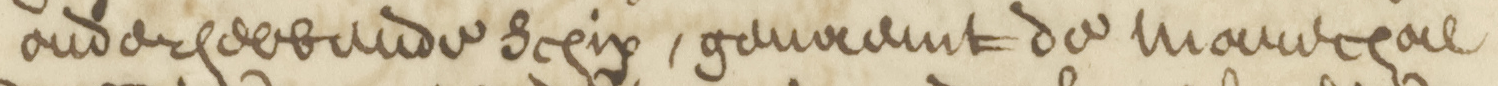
onderhebbende Schip, genaemt de Marechal
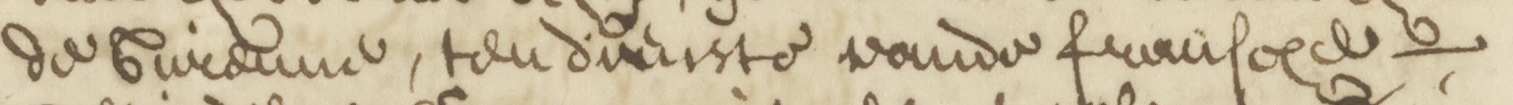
de Turenne, ten dienste vande fransche —
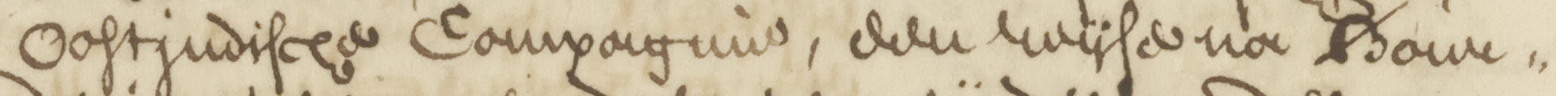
Oostindische Compagnie, een reijse na Bour,,
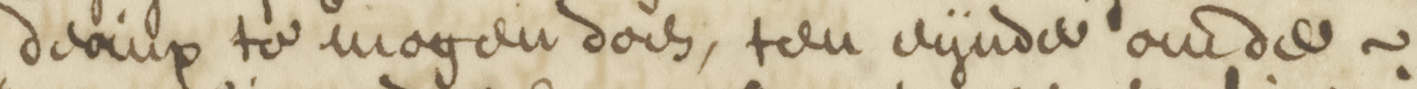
„deaux te mogen doen, ten eijnde om de -
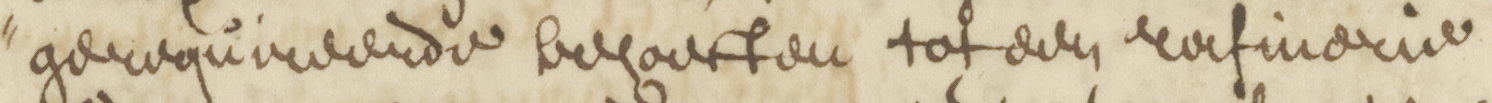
gerequireerde behoeften tot een rafinerie
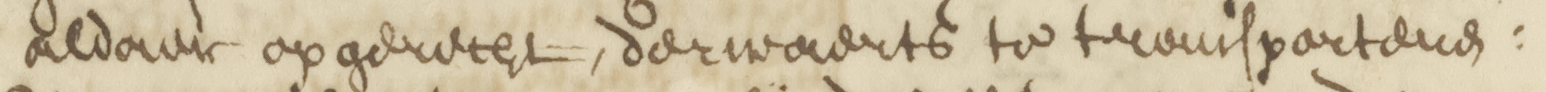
aldaer opgerecht, derwaerts te transporteren:
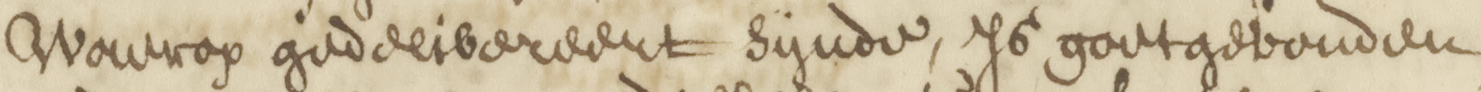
Waerop gedelibereert sijnde, Is goetgevonden,
